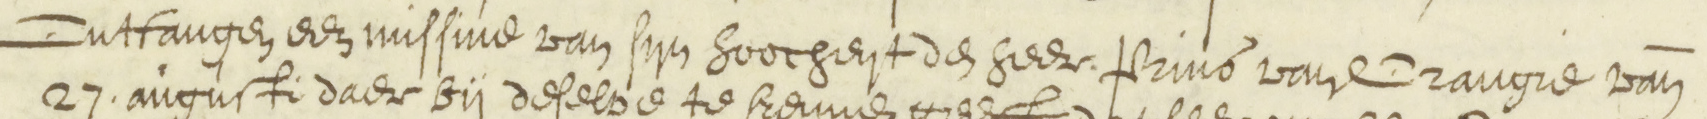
Ontfangen een missive van syn hoocheyt den heer Prins van Orangie van
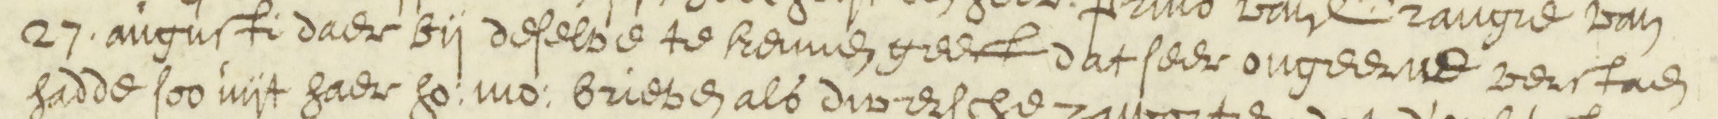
27. augusti daer bij deselve te kennen geeft dat seer ongeerne verstaen
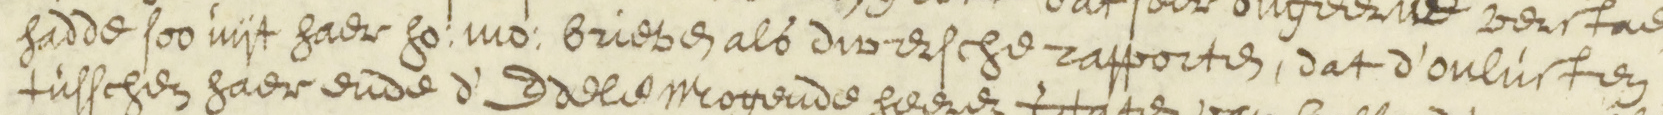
hadde soo uijt haer ho:mo: brieven als diversche rapporten, dat d'onlusten
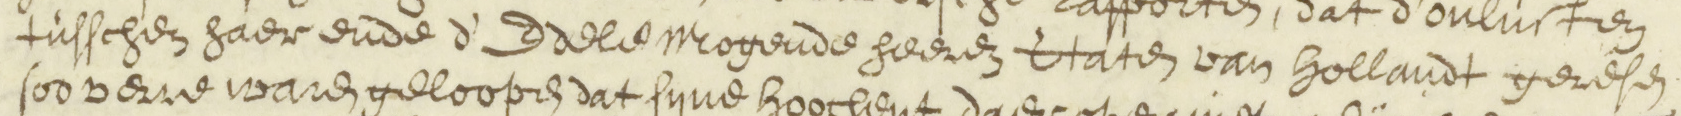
tusschen haer ende d'Edele Mogende heeren Staten van Hollandt geresen
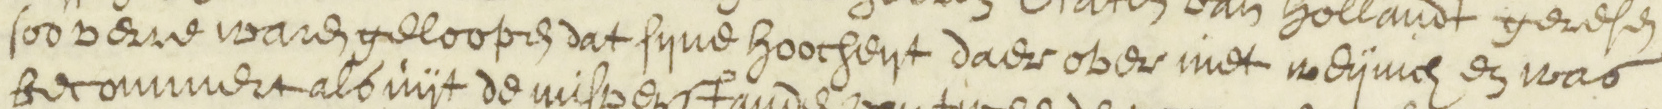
soo verre waren geloopen dat syne hoocheyt daer over niet weijnich en was
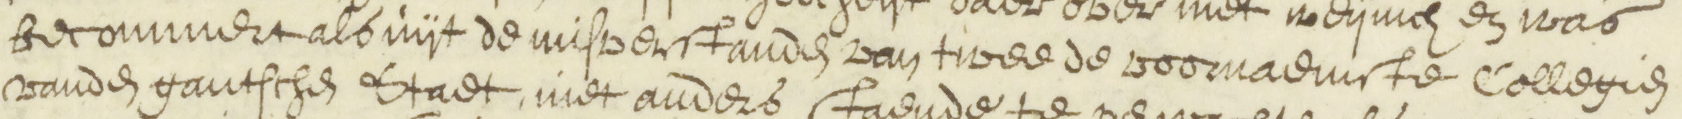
becommert als uijt de misverstanden van tweede voornaemste Collegien
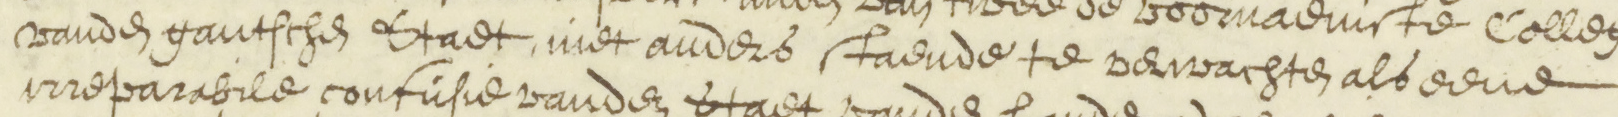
vanden gantschen Staet, niet anders staende te verwachten als eene
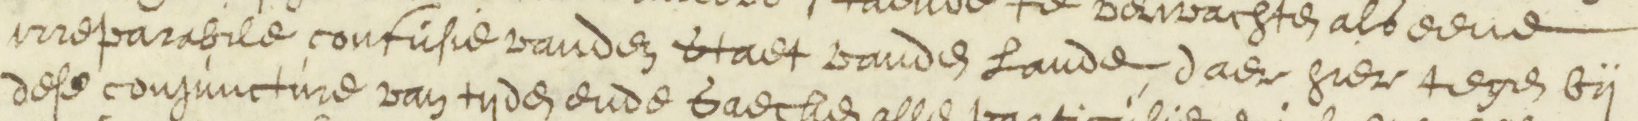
irreparabile confusie vanden Staet vanden Lande daer hier tegen bij
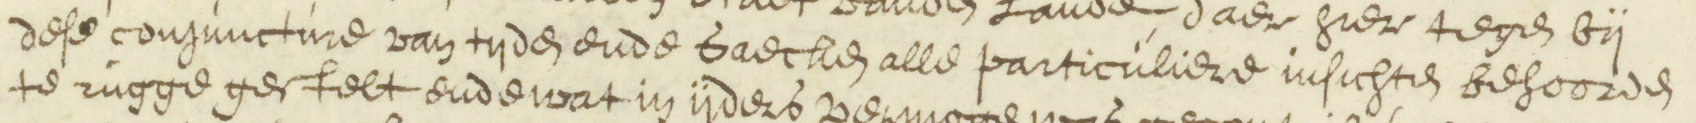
dese conjuncture van tyden ende Saecken alle particuliere insichten behoorden
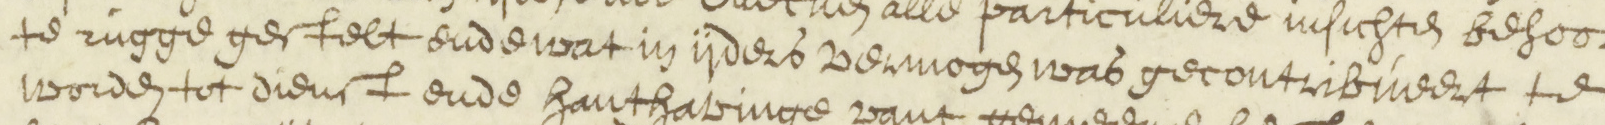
te rugge gestelt ende wat in ijders vermogen was gecontribueert te
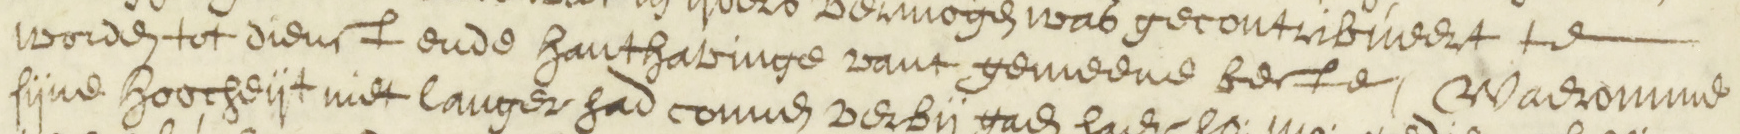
worden tot dienst ende hanthavinge vant gemeene beste. Waeromme
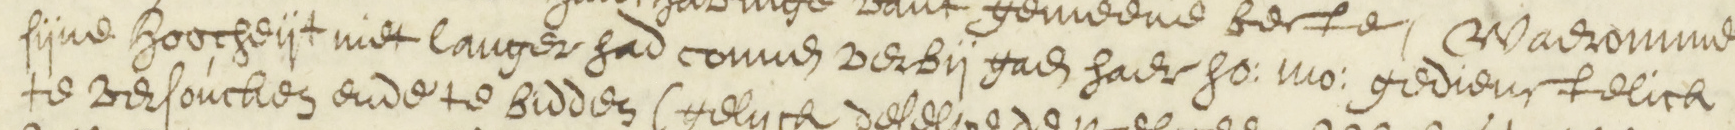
sijne Hoocheijt niet langer had connen verbij gaen haer ho:mo: gedienstelick
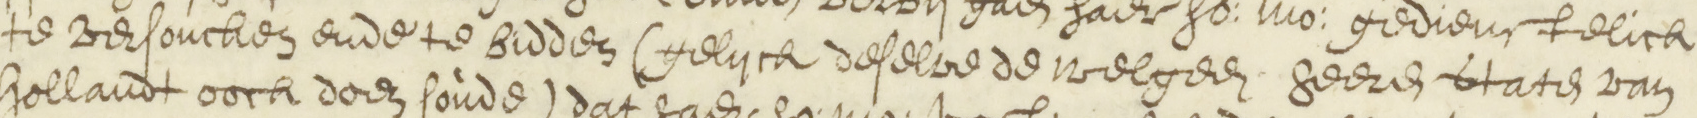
te versoucken ende te bidden (gelyck deselve de welgee. heeren Staten van
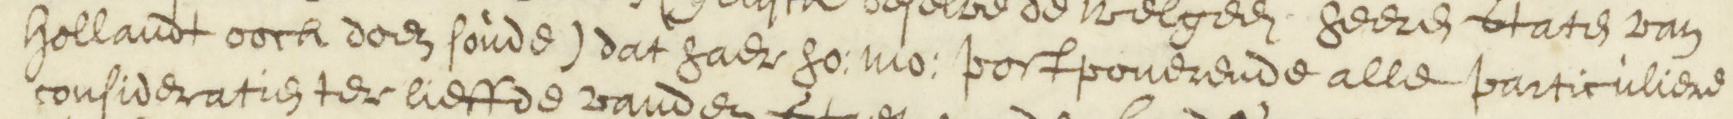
hollandt oock doen soude) dat haer ho:mo: postponerende alle particuliere
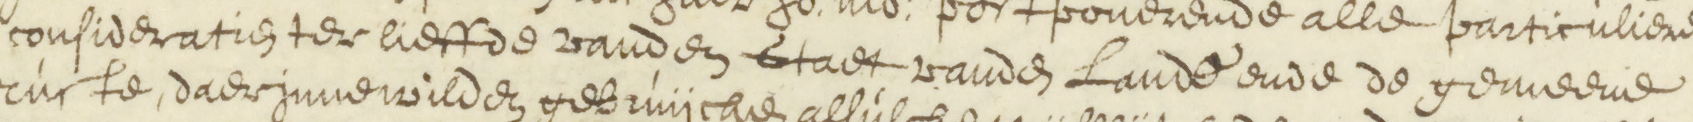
consideratien ter lieffde vanden Staet vanden Lande ende de gemeene
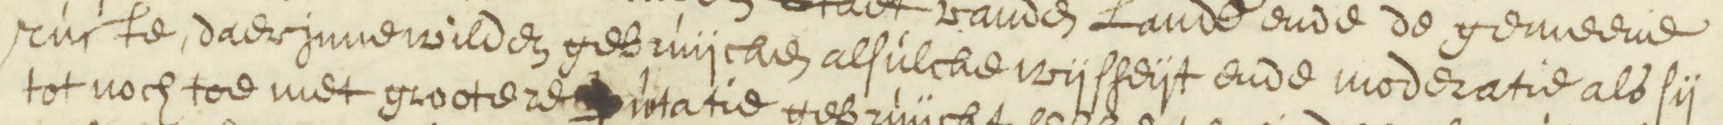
ruste, daerinne wilden gebruijcken alsulcke wijsheijt ende moderatie als sij
